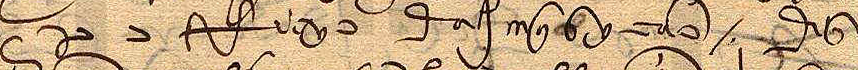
Sto officyo da Jmq̄syçaõ /. dise
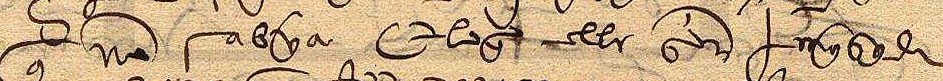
q̄ nō sabya E logo elle s̄or Jmq̄sydor
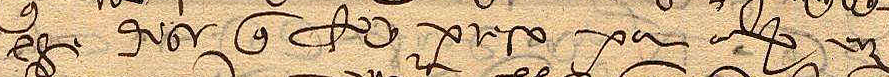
lhe dise q̄ foy preso pa aꝟ em
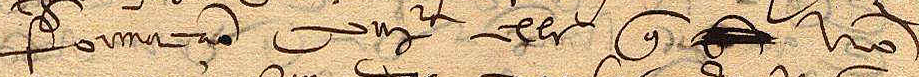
formação contra elle q̄ _ nō
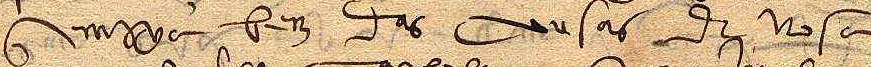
semtya bem das cousas de nosa
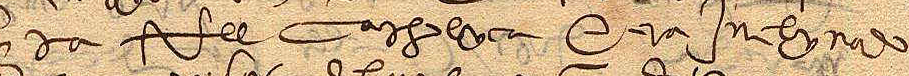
Sta ffee Catholyca e era Jnclynado
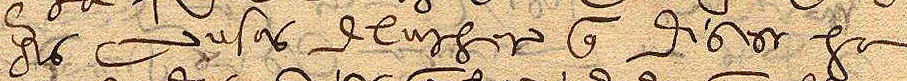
As cousas de luthero q̄ disese ha
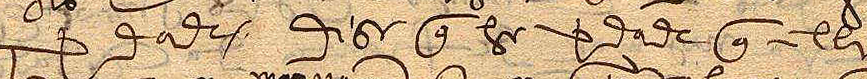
ꝟdade /. dise q̄ he ꝟdade q̄ elle
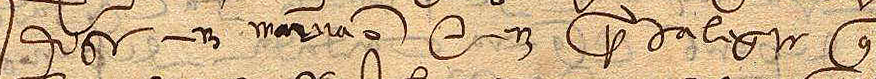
dise em maruaõ e em p̄otalegre q̄
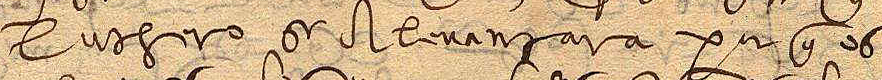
luthero se Aleuantara porq̄ os
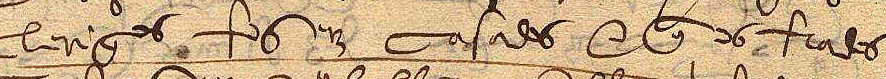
leigos fosem casados e q̄ os frades
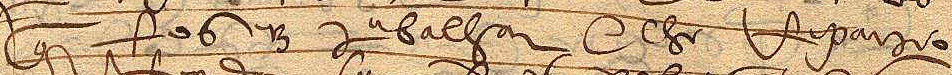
q̄ fosem trabalhar e lhe Repartio
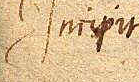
Jncipit
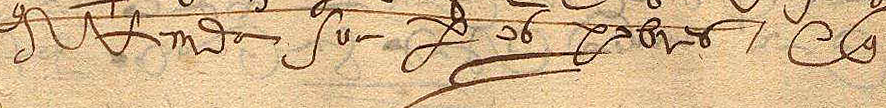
A Remda sua ꝑ os pobres / e q̄
